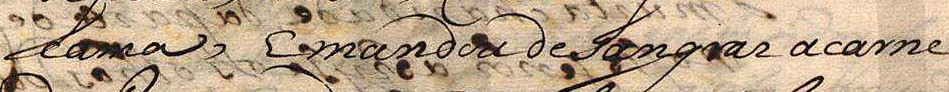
cama. E mandou desangrar a carne
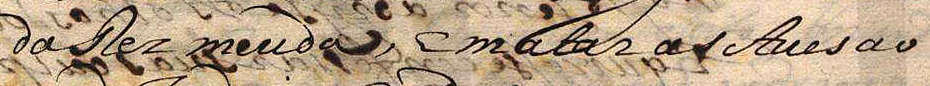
da Rez meuda, e matar as Aues ao
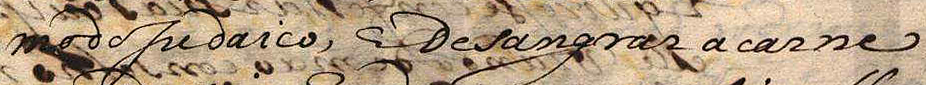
modo Judaico, E Desangrar a carne
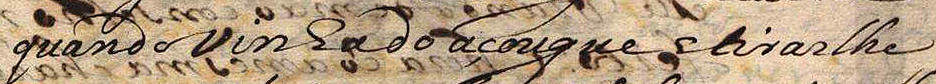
quando vinha do açougue E tirarlhe
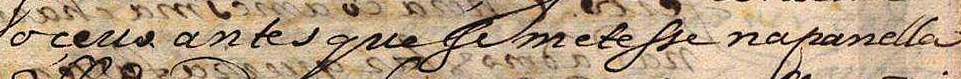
o çeuo antes que se metesse na panella
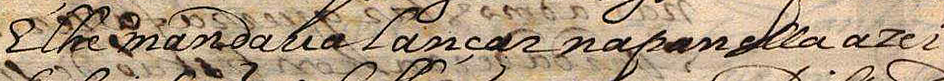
E lhe mandaua lançar na panella azei
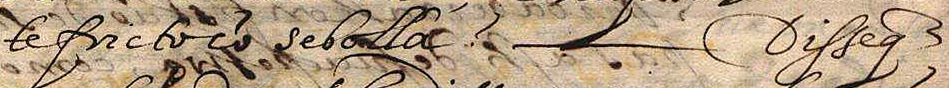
te fricto cō sebolla? ‒ Disse q̄
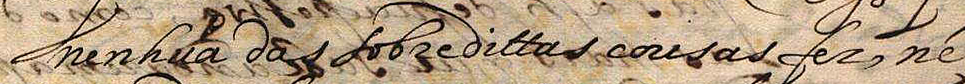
nenhua das sobredittas cousas fez, nē
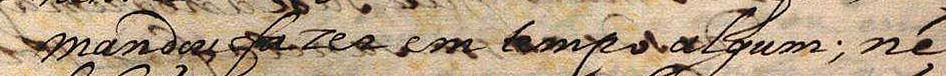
mandou fazer em tempo algum; nē
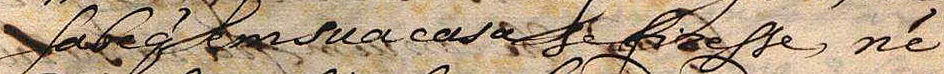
sabe q̄ em sua casa se fizesse, nē
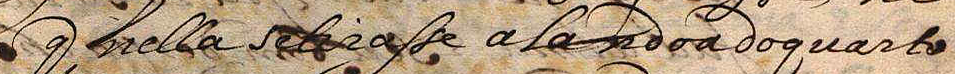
q̄ nella se tirasse a landoa do quarto
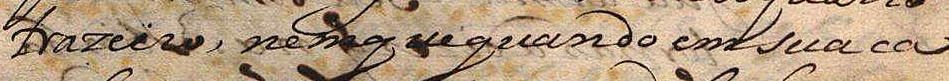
trazeiro, nem que quando em sua ca
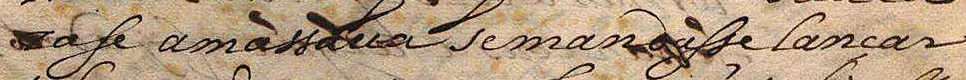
za se amassaua se mandasse lançar
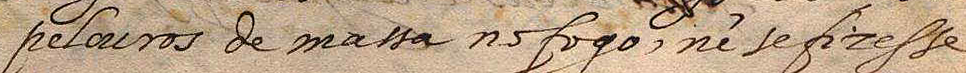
pelouros de massa no fogo, nē se fizesse
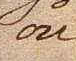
ou
